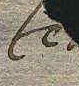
te
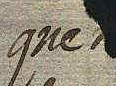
que
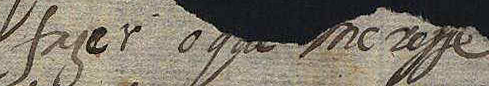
fazer o que meresse
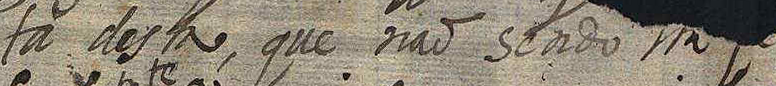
ta desta, que naõ sendo vm p
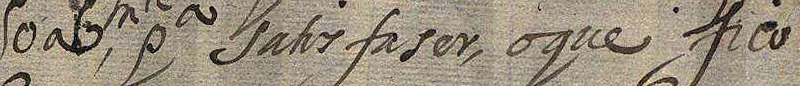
soalmte, pa satisfaser, o que fico
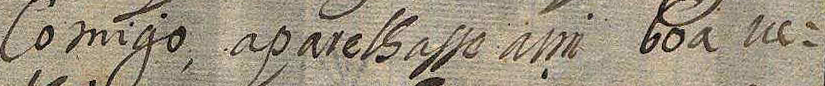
Comigo, aparelhasse a vm boa ue
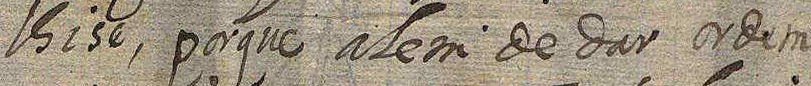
lhise, porque alem de dar ordem
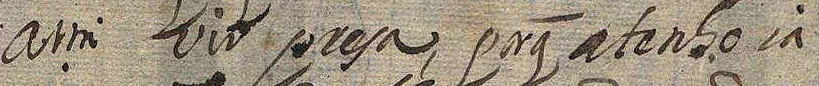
a vm vir presa, porq̄ a tenho ia
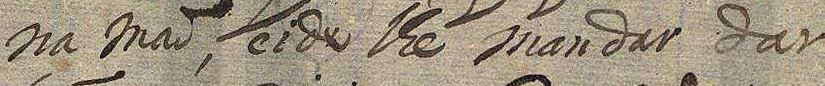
na maõ, eide lhe mandar dar
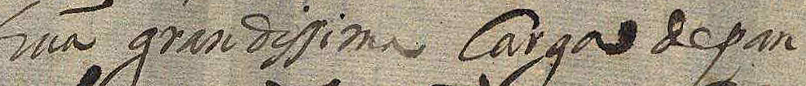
huā grandissima Carga de pan
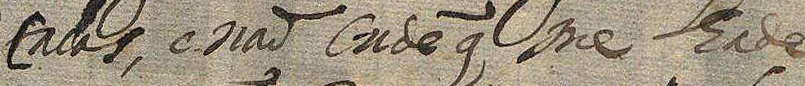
cadas, e não cude q̄ me ha de
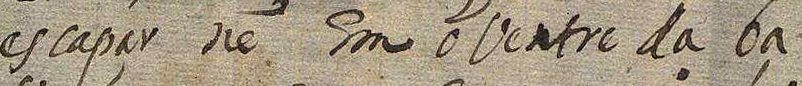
escapar nē Em o ventre da ba
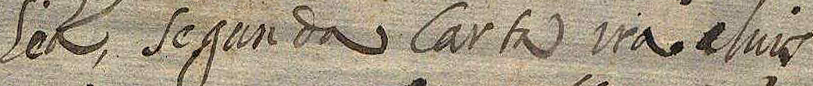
lea, segunda carta ira a luis
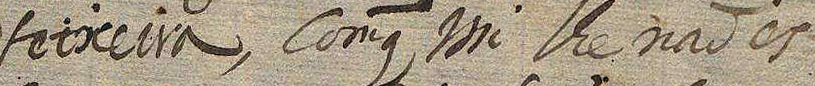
teixeira, com q̄ vm lhe naõ es
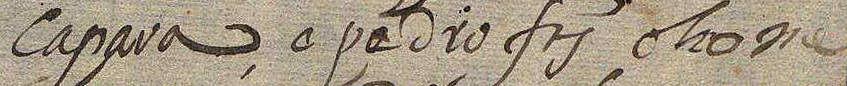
capara, e pedro frs̄ o home
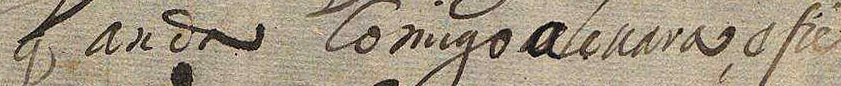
q̄ anda Comigo a leuara, e fie
